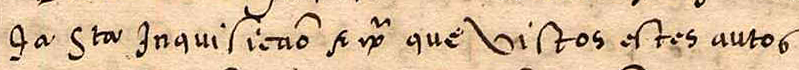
da Sta Jnquisiçaõ e cꝭ̄ que vistos estes autos
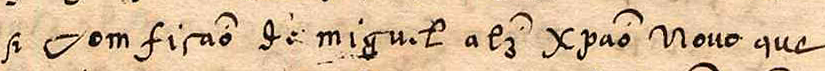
e comfisaõ de miguel alz̄ xpaõ nouo que
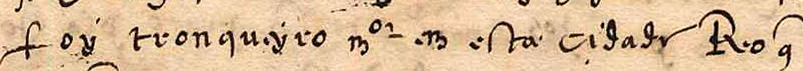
foy tronqueyro mor em esta cidade Reo q̄
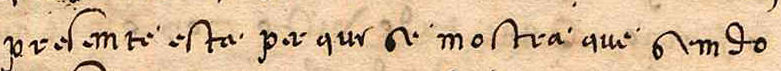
presemte esta per que se mostra que semdo
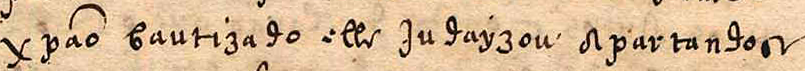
xpão bautizado elle Judayzou Apartandose
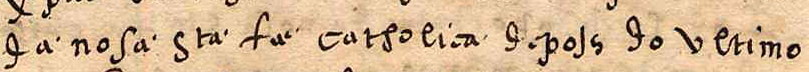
da nosa Sta fee catholica depojs do vltimo
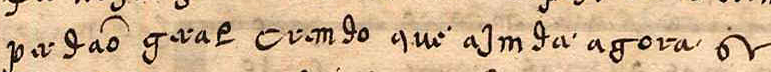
perdaõ geral cremdo que aJnda agora se
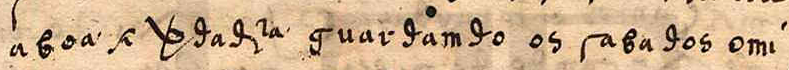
a boa e ꝟdadꝭra guardamdo os sabados o mi
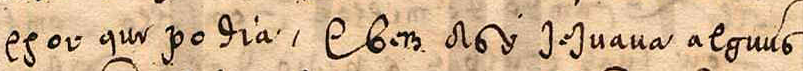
lhor que podia / e bem Asy JeJuaua alguūs
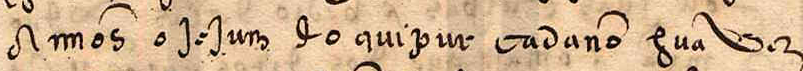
Annōs o JeJum do quipur cadanō hua vez
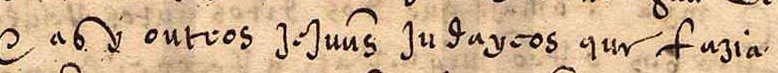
e asy outros JeJuūs Judaycos que fazia
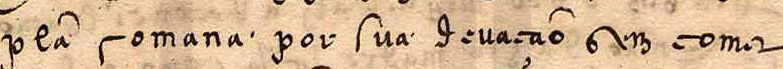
plā somana por sua deuaçaõ sem comer
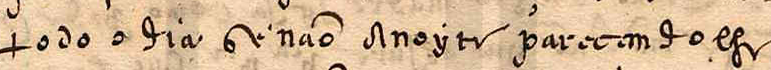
todo o dia senão A noyte parecemdo lhe
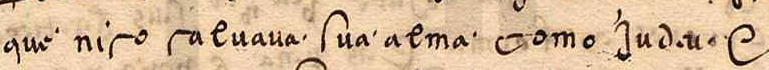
que niso saluaua sua alma como Judeu e
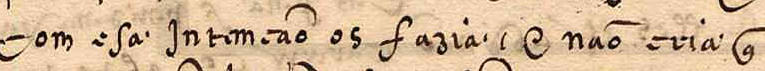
com esa Jntemção os fazia / e naõ cria q̄
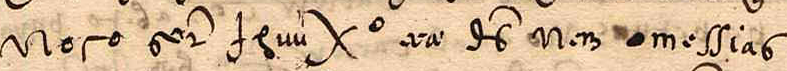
noso sor̄ Jhuu Xo era ds̄ nem o messias
